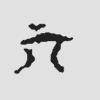亓（其）
